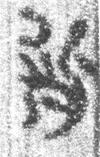{金此}
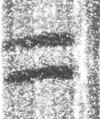二
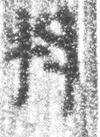友
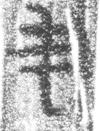屯
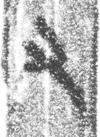又（有）
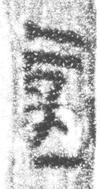盍（蓋）
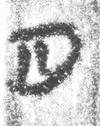四
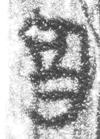合
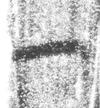一
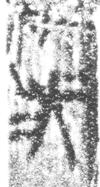舄
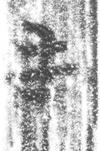屯
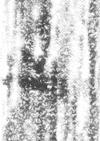又（有）
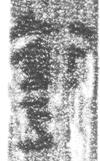盍（蓋）
